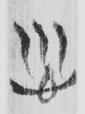{川心}
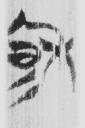穆
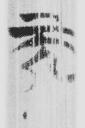而
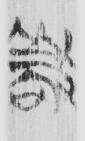敬
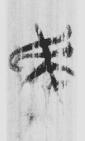民
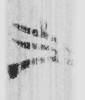之
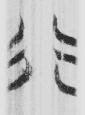行
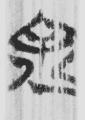余
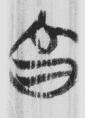亯
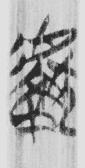獻
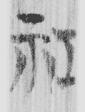{示工}
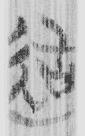适
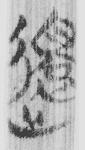還
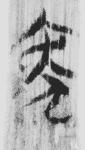{天虫}
